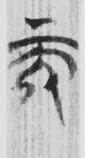而
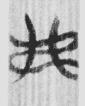弗
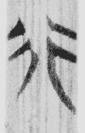行
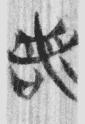若
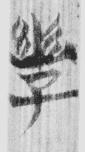{幽子}
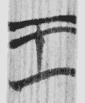王
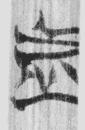者
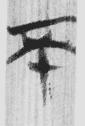不
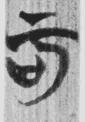可
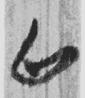㠯（以）
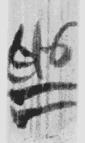爲
